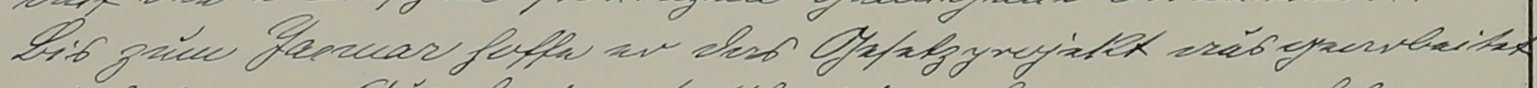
Bis zum Januar hoffe er das Gesetzprojekt ausgearbeitet
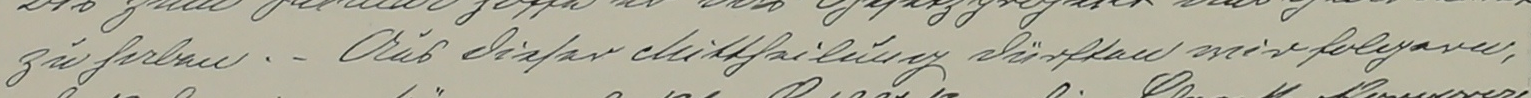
zu haben. – Aus dieser Mittheilung dürften wir folgern,
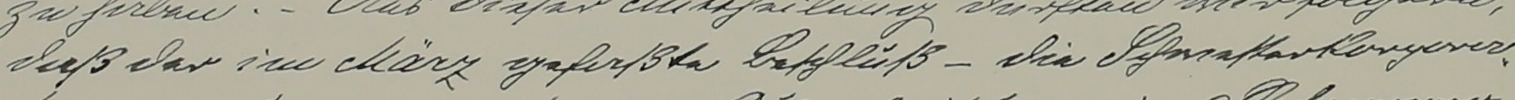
daß der im März gefaßte Beschluß – die Schwesterkorpora-
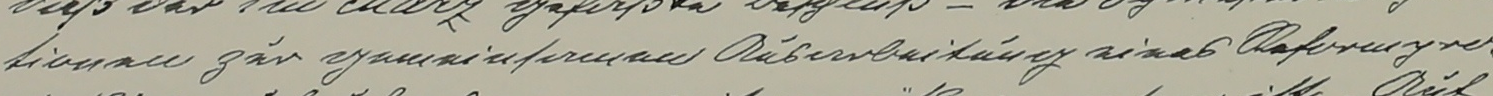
tionen zur gemeinsamen Ausarbeitung eines Reformpro-
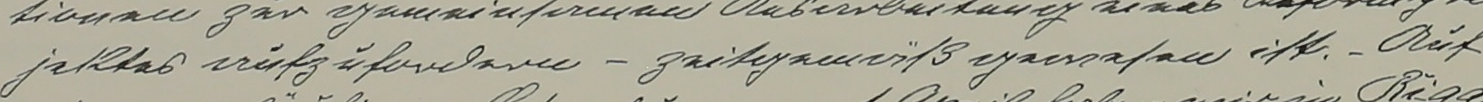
jektes aufzufordern – zeitgemäß gewesen ist. – Auf
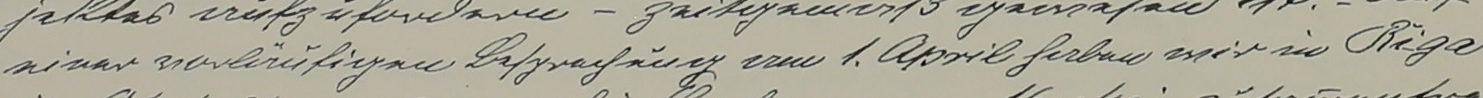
einer vorläufigen Besprechung am 1. April haben wir in Riga
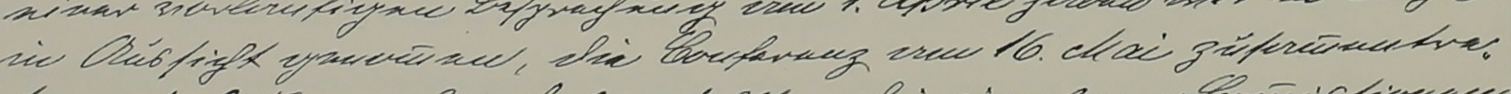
in Aussicht genommen, die Conferenz am 16. Mai zusammentre-
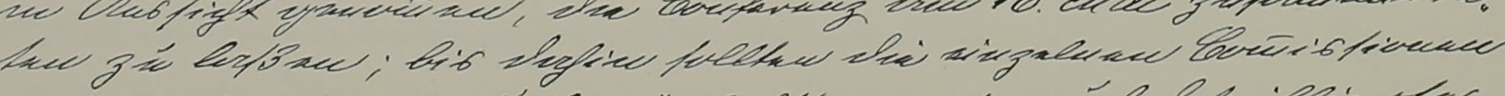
ten zu laßen; bis dahin sollten die einzelnen Commissionen
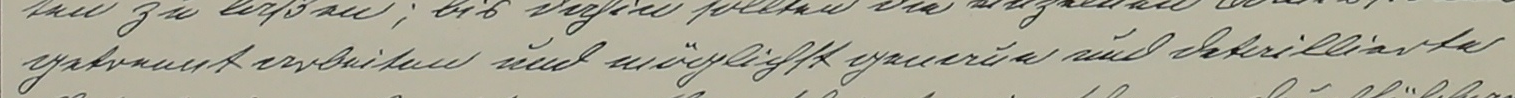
getrennt arbeiten und möglichst genaue und detaillierte
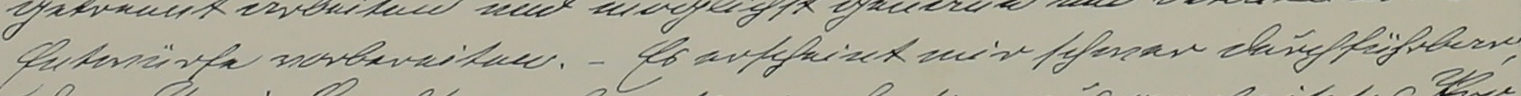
Entwürfe vorbereiten. - Es erscheint mir schwer durchführbar,
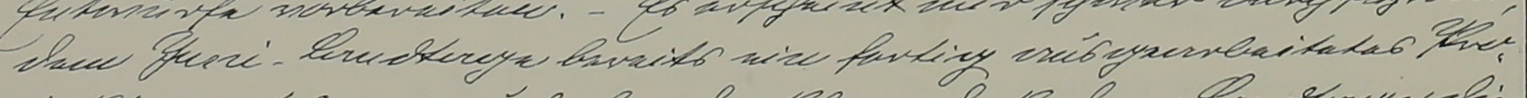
dem Juni-Landtage bereits ein fertig ausgearbeitetes Pro-
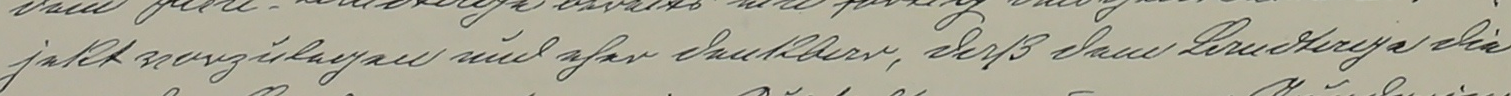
jekt vorzulegen und eher denkbar, daß dem Landtage die
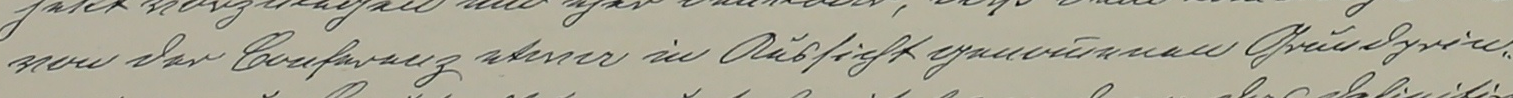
von der Conferenz etwa in Aussicht genommenen Grundprin-
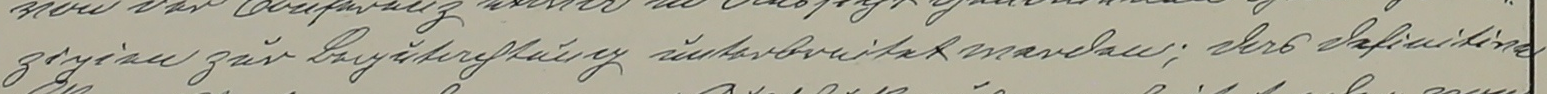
zipien zur Begutachtung unterbreitet werden; das definitive
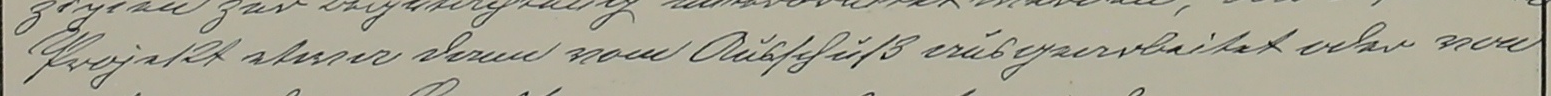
Projekt etwa dann vom Ausschuß ausgearbeitet oder von
